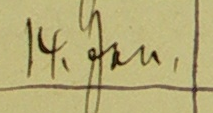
14. Jan
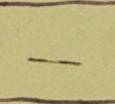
--
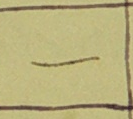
--
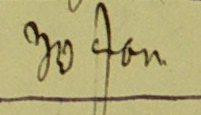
30. Jan.
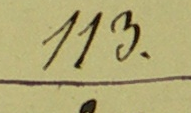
113
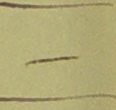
--
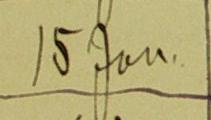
15. Jan.
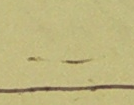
--
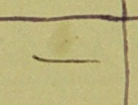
--
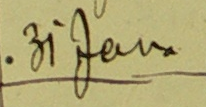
31. Jan.
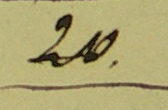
20
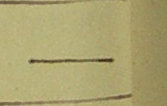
--
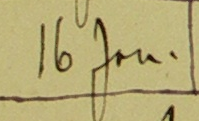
16. Jan.
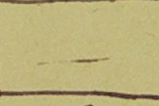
--
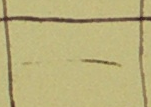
--
